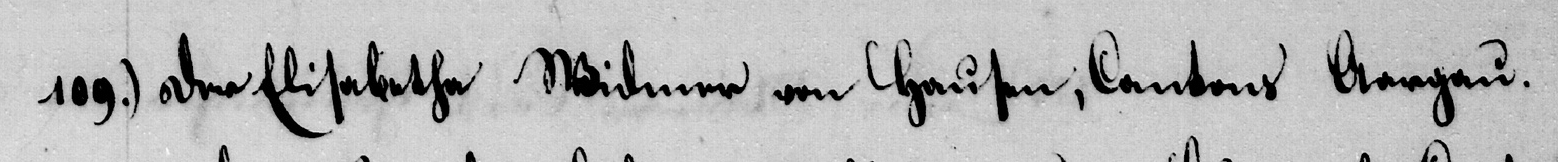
109.) Der Elisabetha Widmer von Hausen, Cantons Aargau.
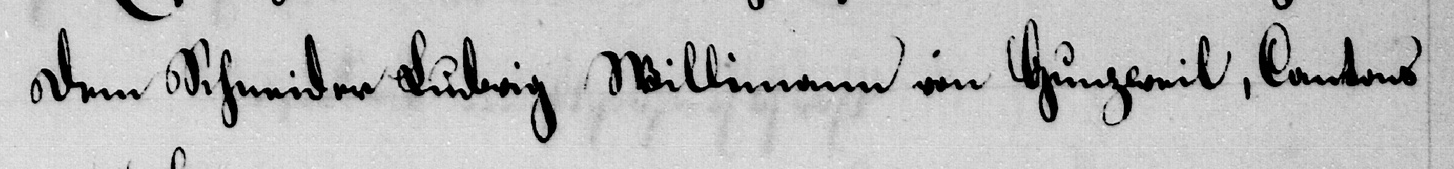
Dem Schneider Ludwig Willimann von Gunzweil, Cantons
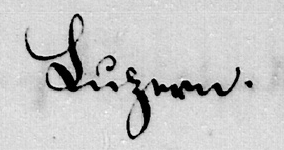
Luzern.
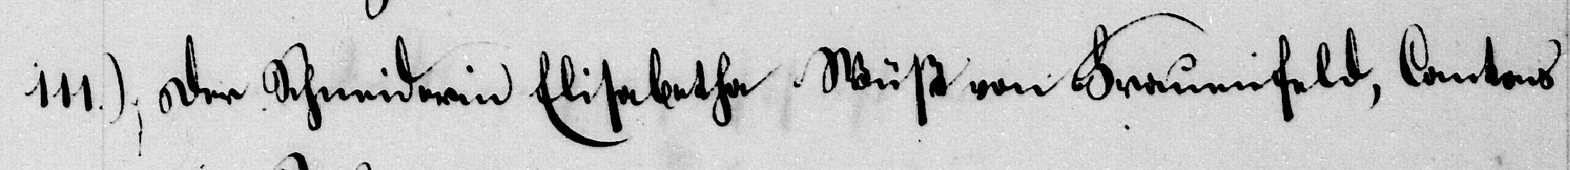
111.) Der Schneiderin Elisabetha Wüst von Frauenfeld, Cantons
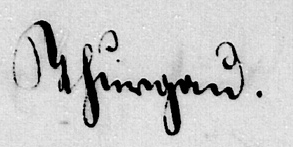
Thurgau.
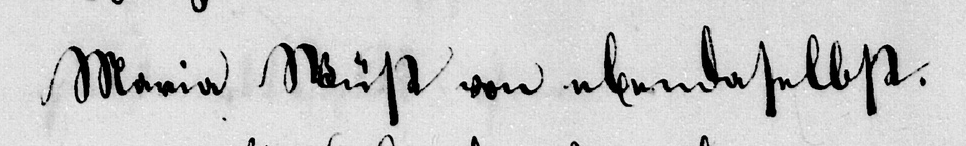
Maria Wüst von ebendaselbst.
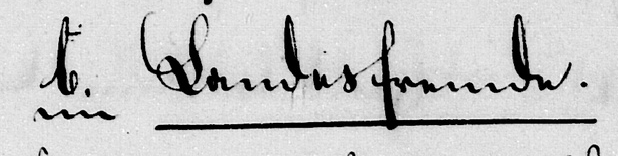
b. Landesfremde.
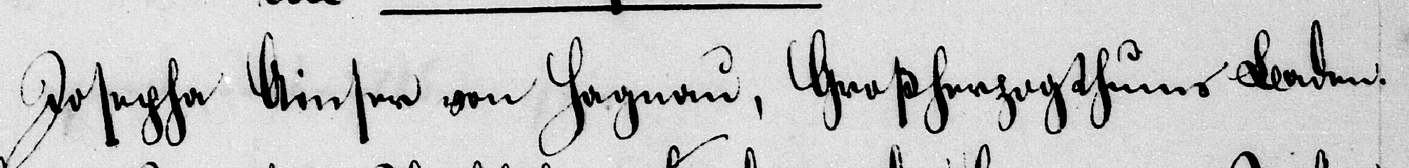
Josepha Ainser von Hagnau, Großherzogthums Baden.
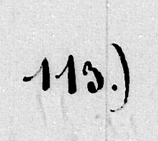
113.)
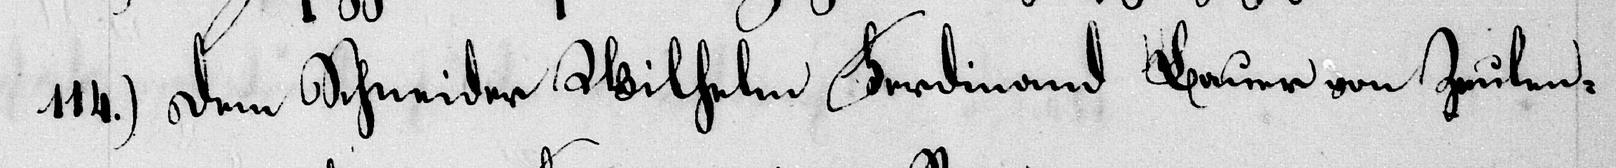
114.) Dem Schneider Wilhelm Ferdinand Bauer von Zeulen¬
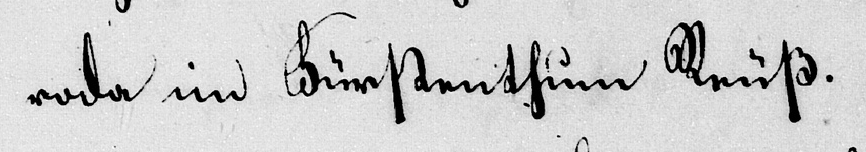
roda im Fürstenthum Reuß.
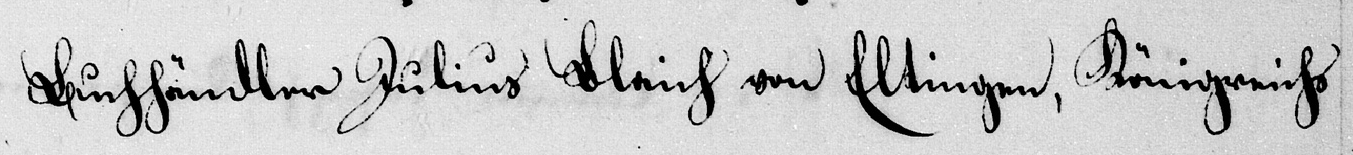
Buchhändler Julius Blaich von Eltingen, Königreichs
